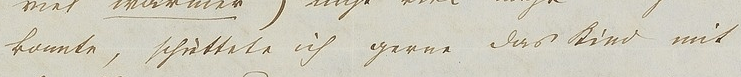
konnte, schüttete ich gerne das Kind mit
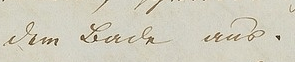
dem Bade aus.
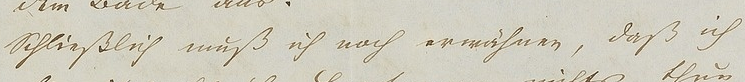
Schließlich muß ich noch erwähnen, daß ich
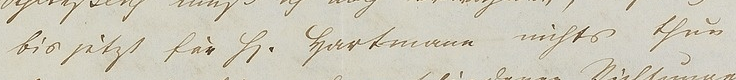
bis jetzt für H. Hartmann nichts thun
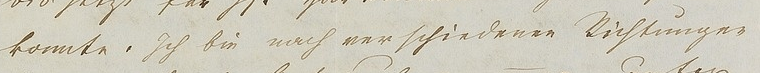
konnte. Ich bin nach verschiedenen Richtungen
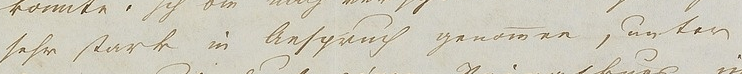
sehr stark in Anspruch genommen, unter
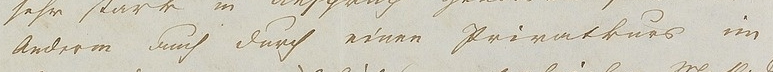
Anderm auch durch einen Privatkurs im
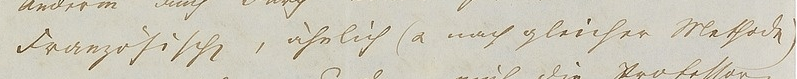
Französischen, ähnlich (& nach gleicher Methode)
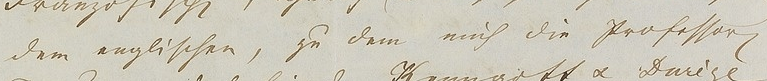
dem englischen, zu dem mich die Professoren
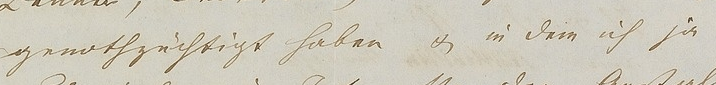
genothzüchtigt haben & in dem ich ja
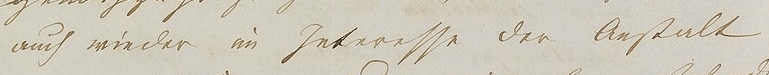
auch wieder im Interesse der Anstalt
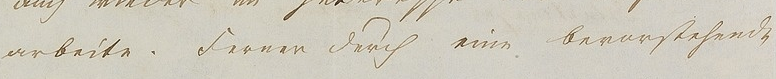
arbeite. Ferner durch eine bevorstehende
